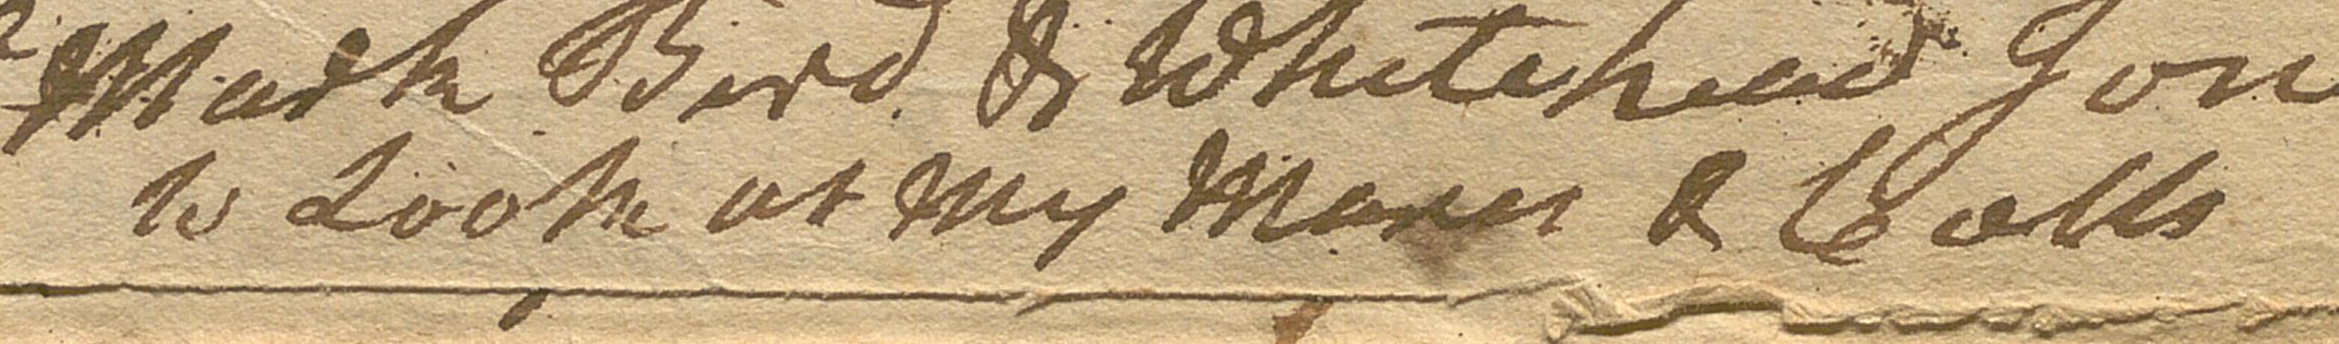to Look at My Mares & Calls
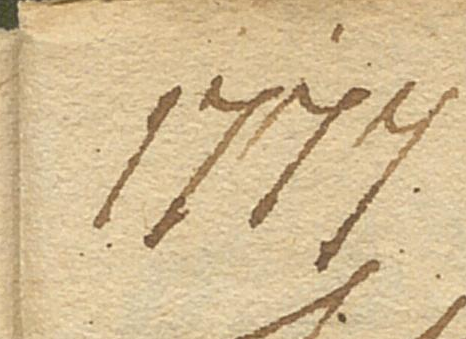1777
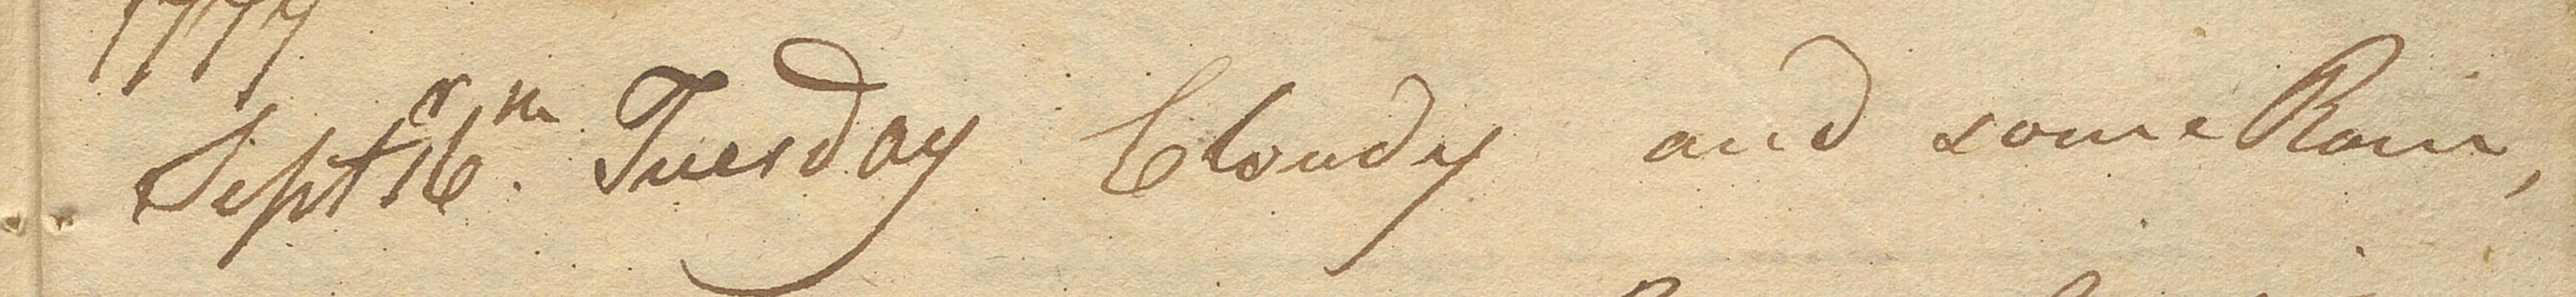Sept^r 16^th. Tuesday Cloudy and some Rain
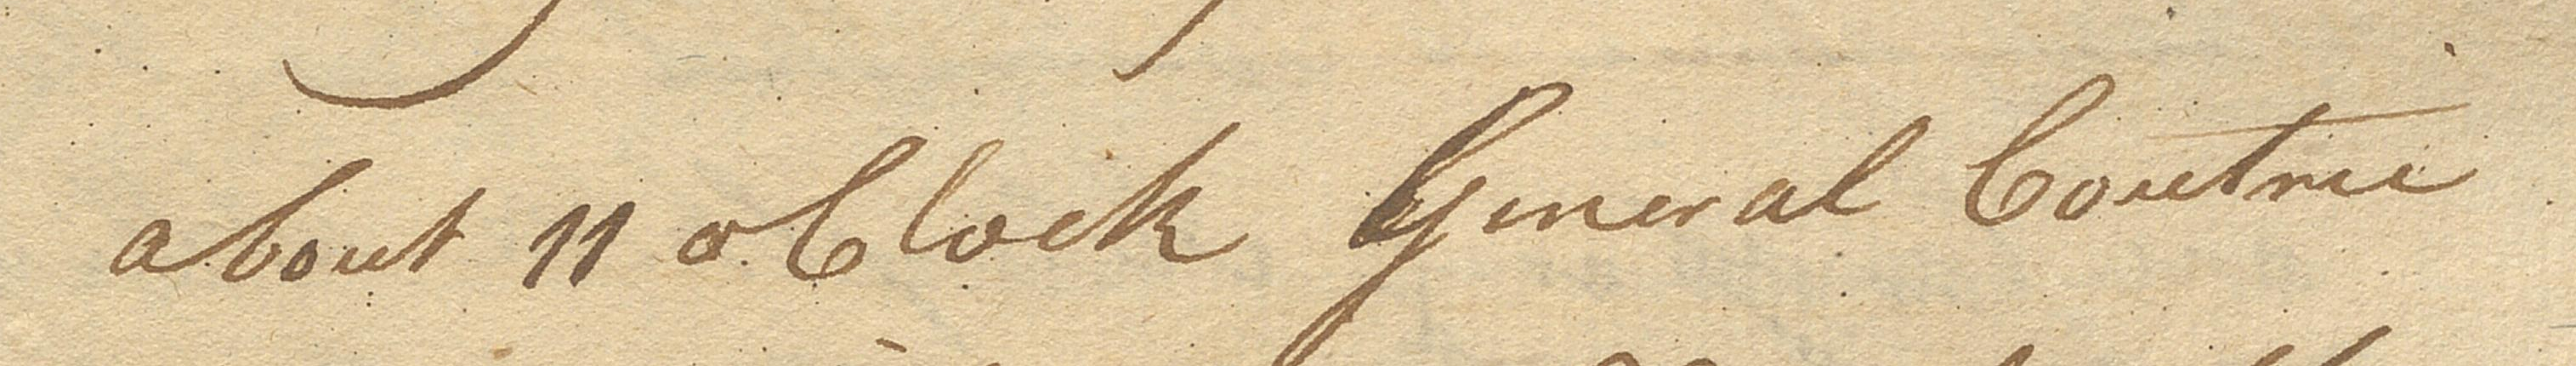about 11 oClock General Coutree
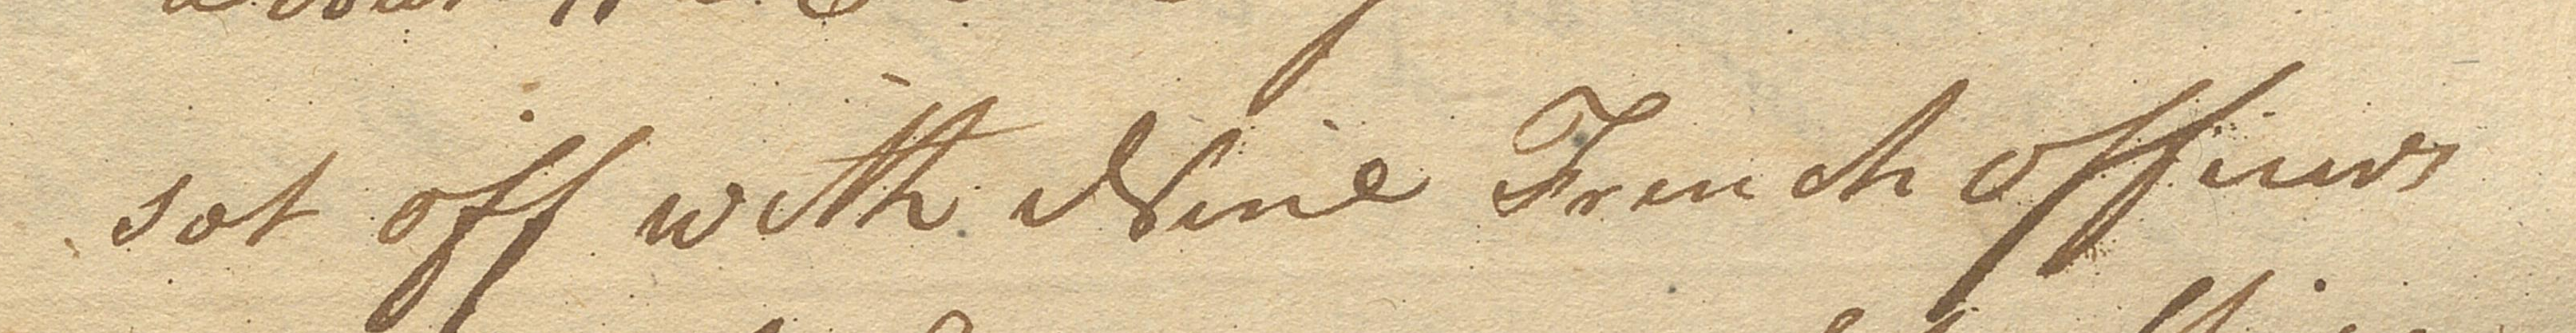sot off with Nine French officers
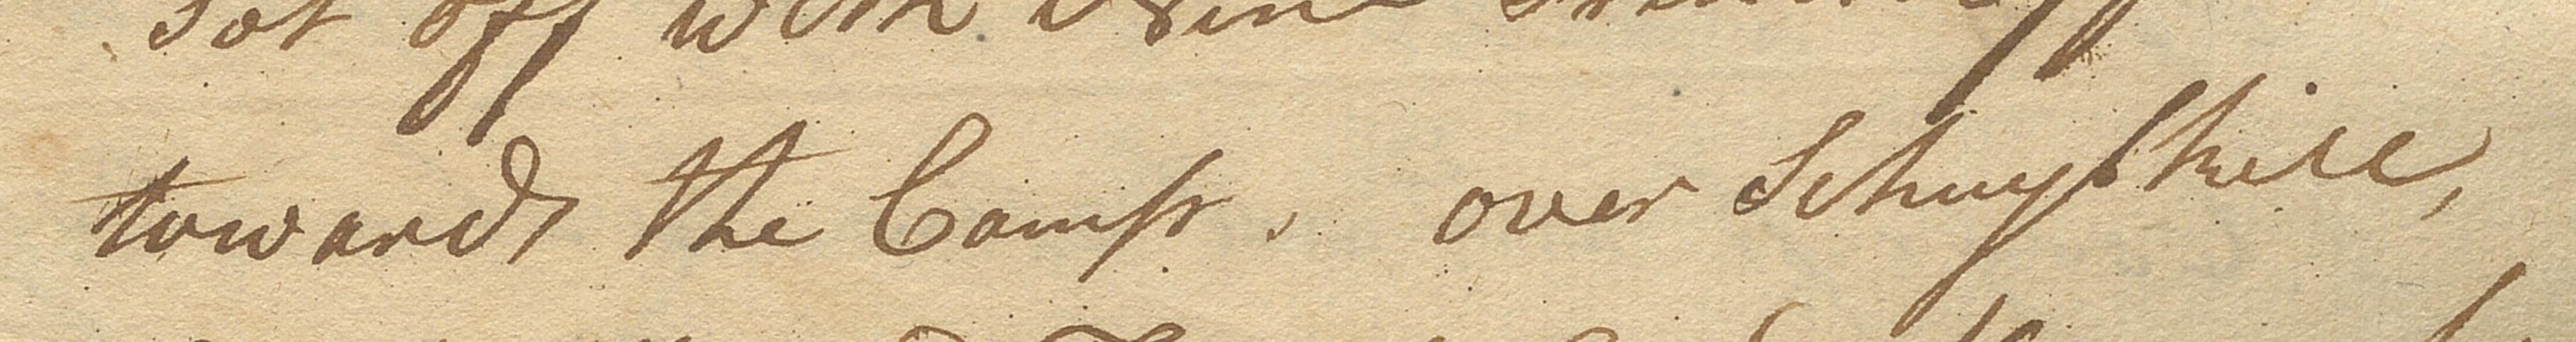towards the Camp, over Schuylkill,
